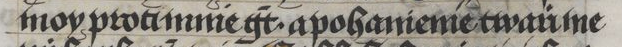moy proti mnie ḡt.a pohanieníe twaṙi me
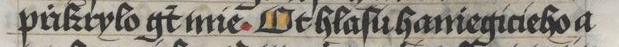přikrylo ḡt mie.Ot hlaſu haniegícíeho a
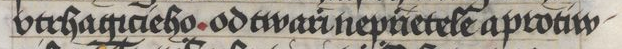vtrhagicíeho.od twaři nepříetele aprotíw¬
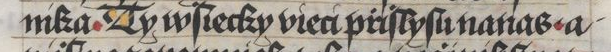níka.Ty wẛiecky vieci pṙiẛlyſu nanas.a¬
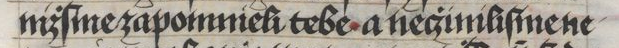níżſme zapomnieli tebe.a necżiníliſme ne¬
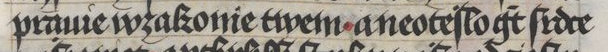prauie wzakonie twem.a neoteẛlo ḡt ſrdce
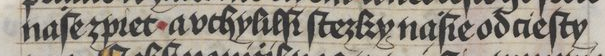naẛe zpiet.a vchylilſi ſtezky naẛie od cieſty
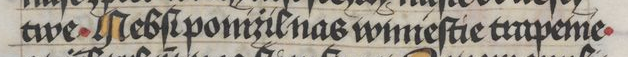twe.Nebſi ponížil nas wmíeſtie trapeníe.
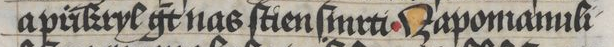a pṙikryl ḡt nas ſtien ſmrti.Zapomanuli
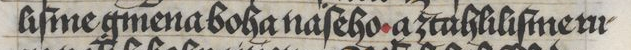liſme gmena boha naẛeho.a ztahliliſme ru¬
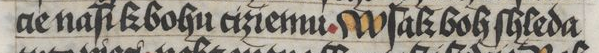cie naẛi kbohu ciziemu.Wẛak boh ſhleda
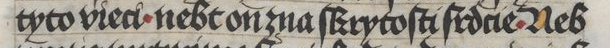tyto vieci.nebt on zna ſkrytoſti ſrdcie.Neb
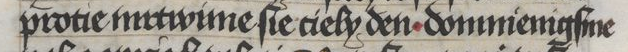protie mrtwime ſie ciely den.domnienigſme
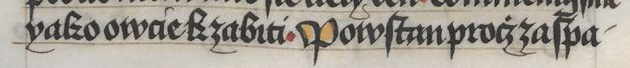yako owcie k zabiti.Powſtan procż zaſpa¬
